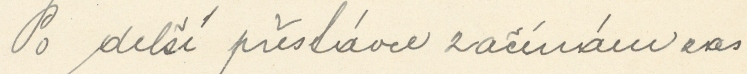Po delší přestávce začínám zas
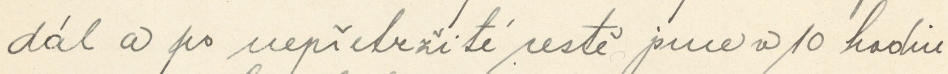dál a po nepřetržité cestě jsme v 10 hodin
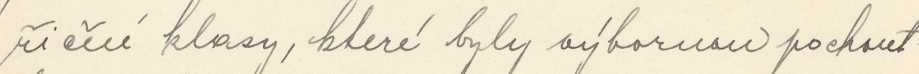řičné klasy, které byly výbornou pochout-
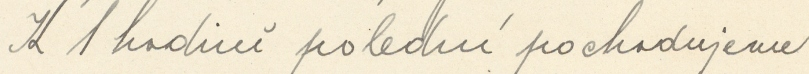K 1 hodině polední pochodujeme
